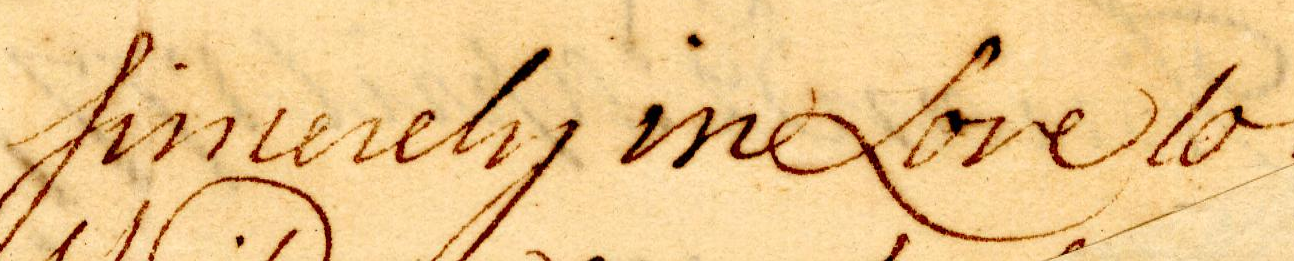Sincerely in Love to
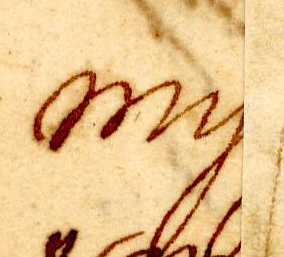my
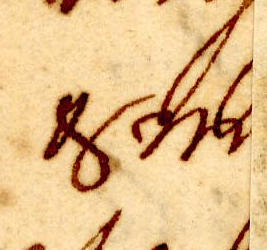& m-
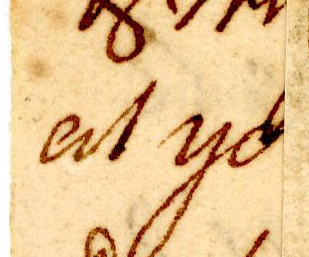at yo-
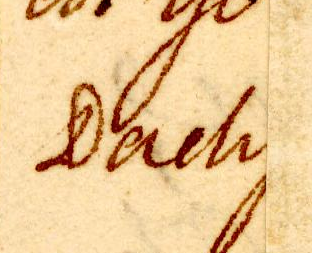Dach-
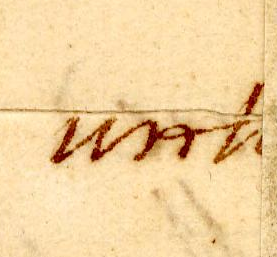unt-
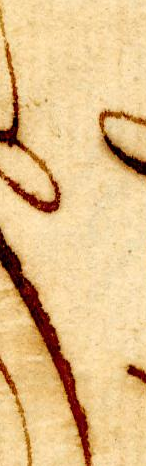To
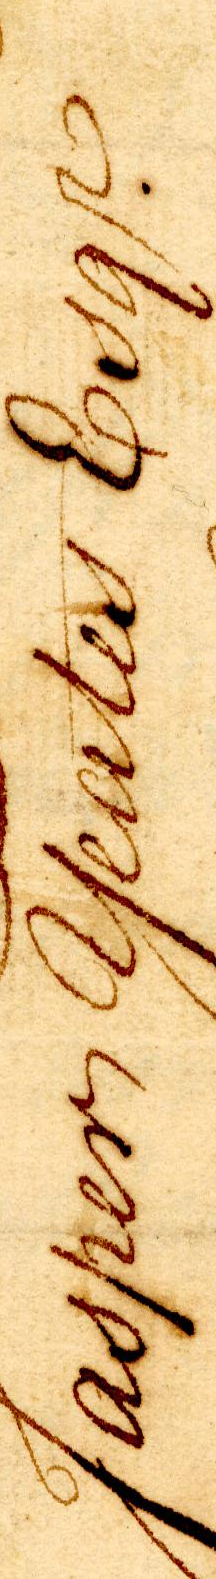Jasper Yeates Esq^r.
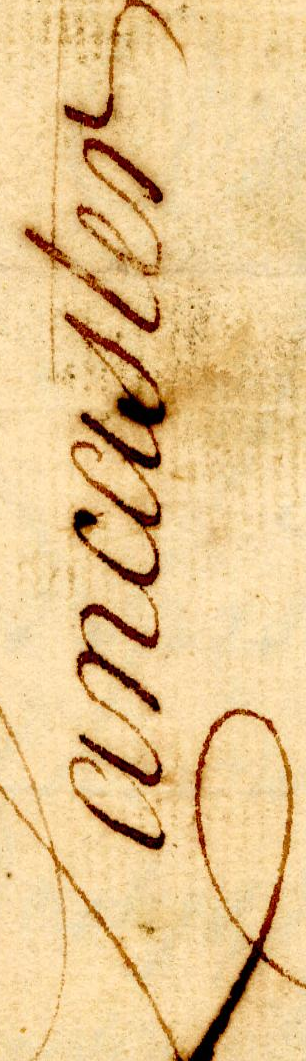Lancaster
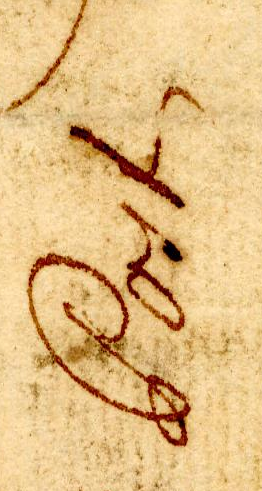Post
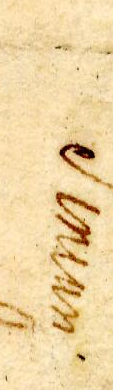Tinian
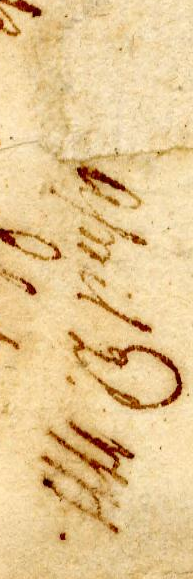April 2^d. 1777.
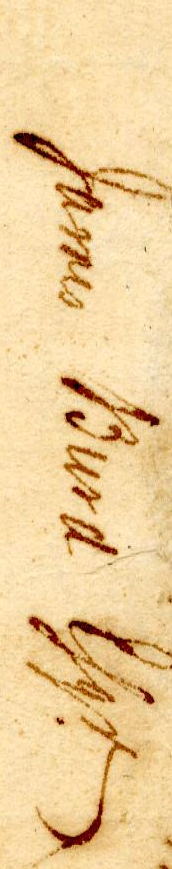James Burd Esq^r.
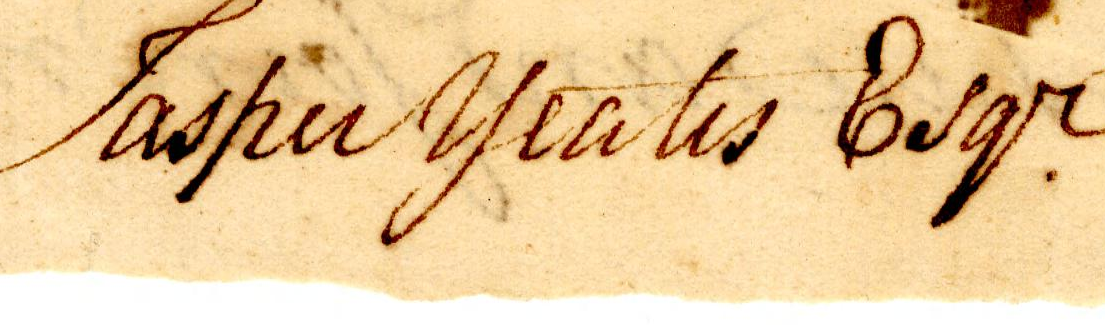Jasper Yeates Esq^r
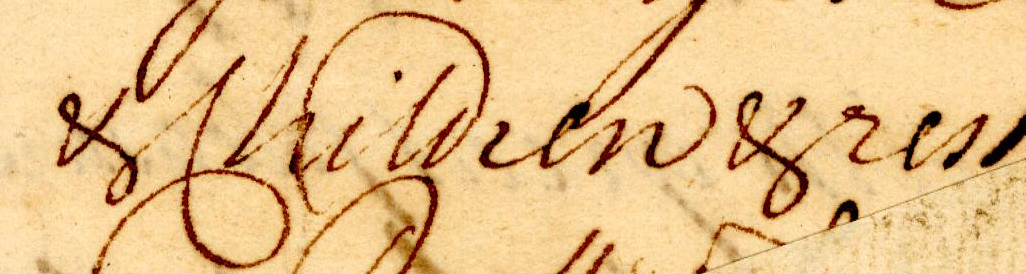& Children & rest
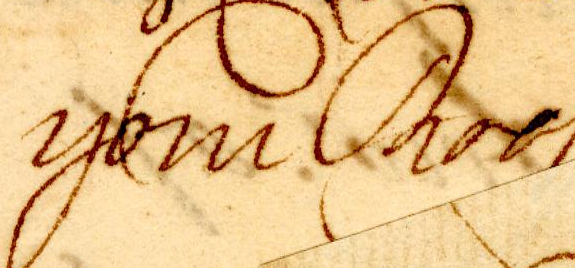Your Roall
